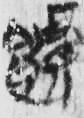饋
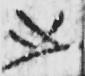之
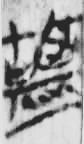○（盬）
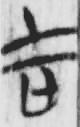吉
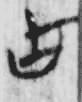占
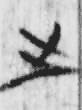之
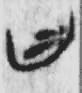曰
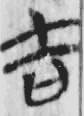吉
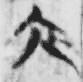太
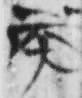矦（后）
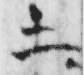土
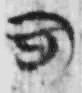司
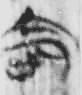命
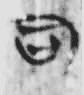司
